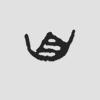自
